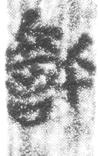○（慎）
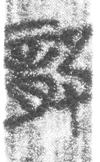○（恭）
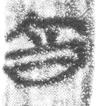亯
